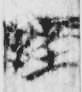陵
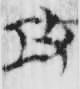攻
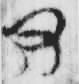尹
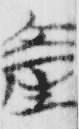產
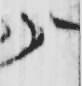少
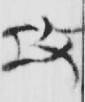攻
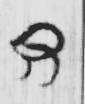尹
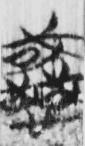惑
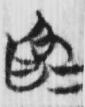爲
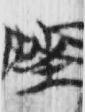陵
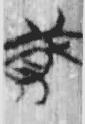貸
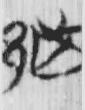○（越）
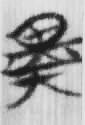異
